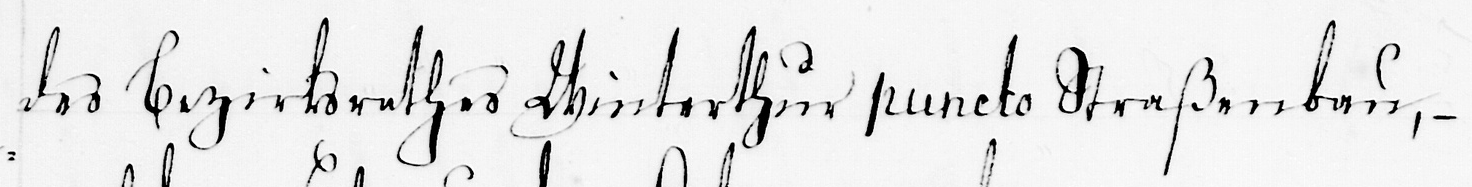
des Bezirksrathes Winterthur puncto Straßenbau,
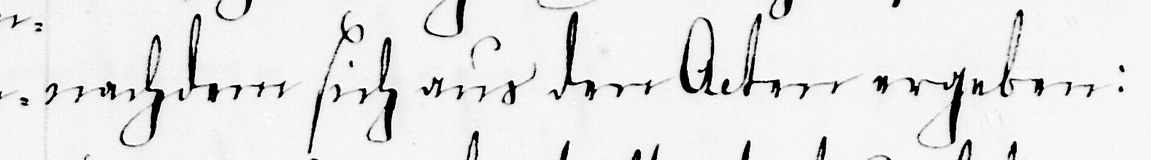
nachdem sich aus den Acten ergeben:
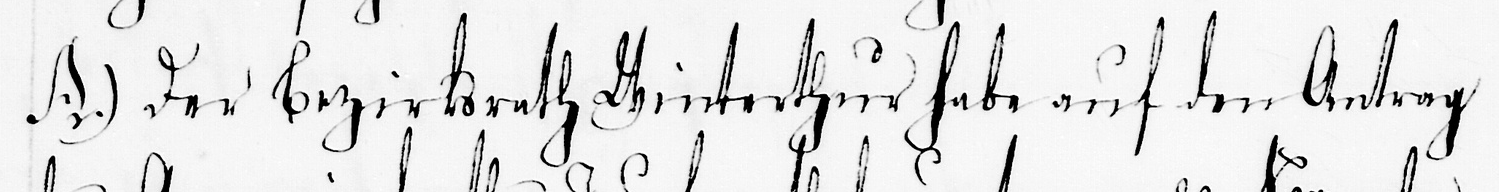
A.) Der Bezirksrath Winterthur habe auf den Antrag
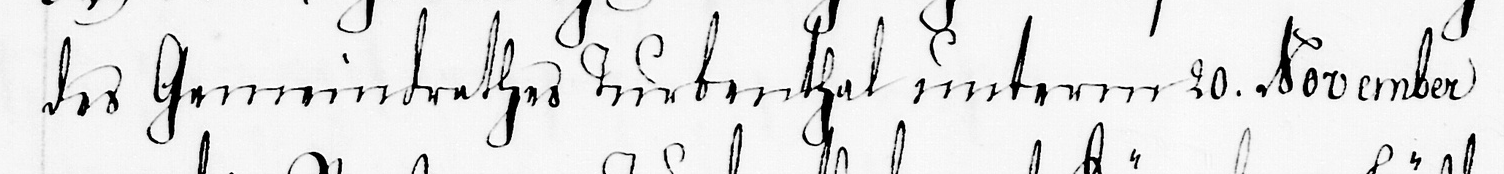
des Gemeindrathes Turbenthal unterm 20. November
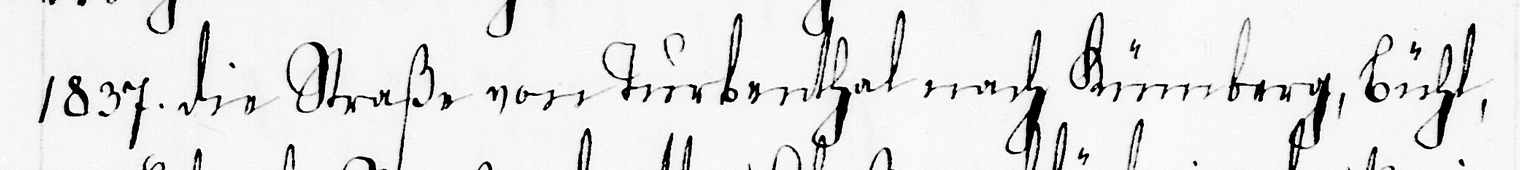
1837. die Straße von Turbenthal nach Kümberg, Bühl,
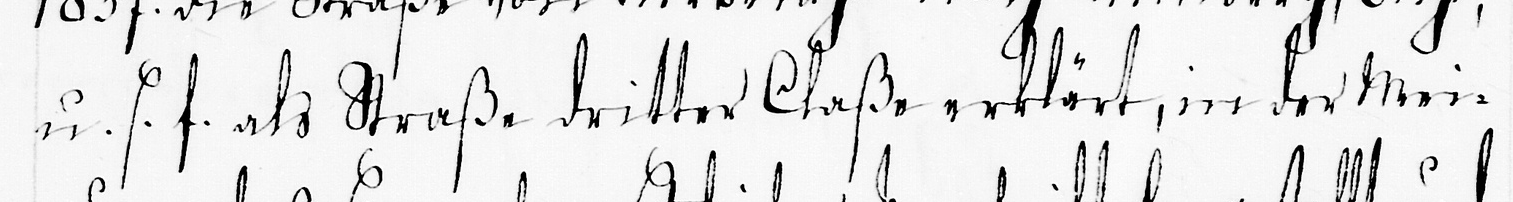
u. s. f. als Straße dritter Claße erklärt, in der Mei¬
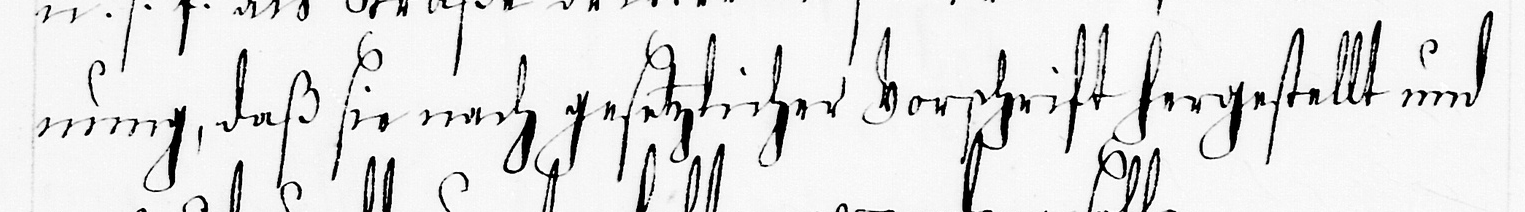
nung, daß sie nach gesetzlicher Vorschrift hergestellt und
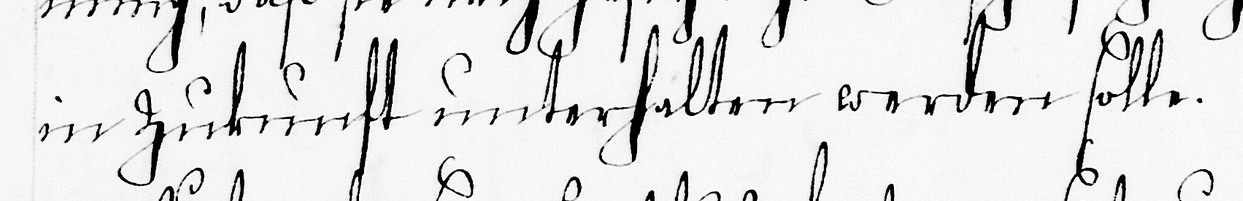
in Zukunft unterhalten werden soll¬
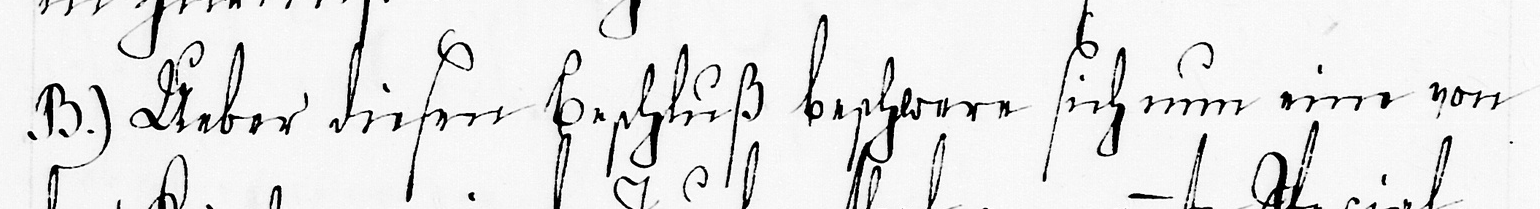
B.) Ueber diesen Beschluß beschwere sich nun eine von
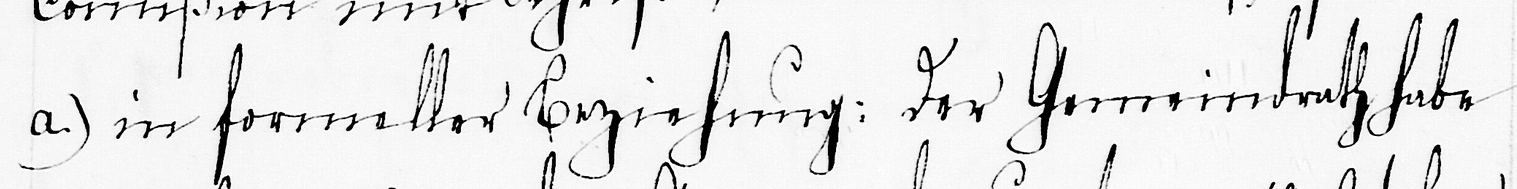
a.) in formeller Beziehung: Der Gemeindrath habe
